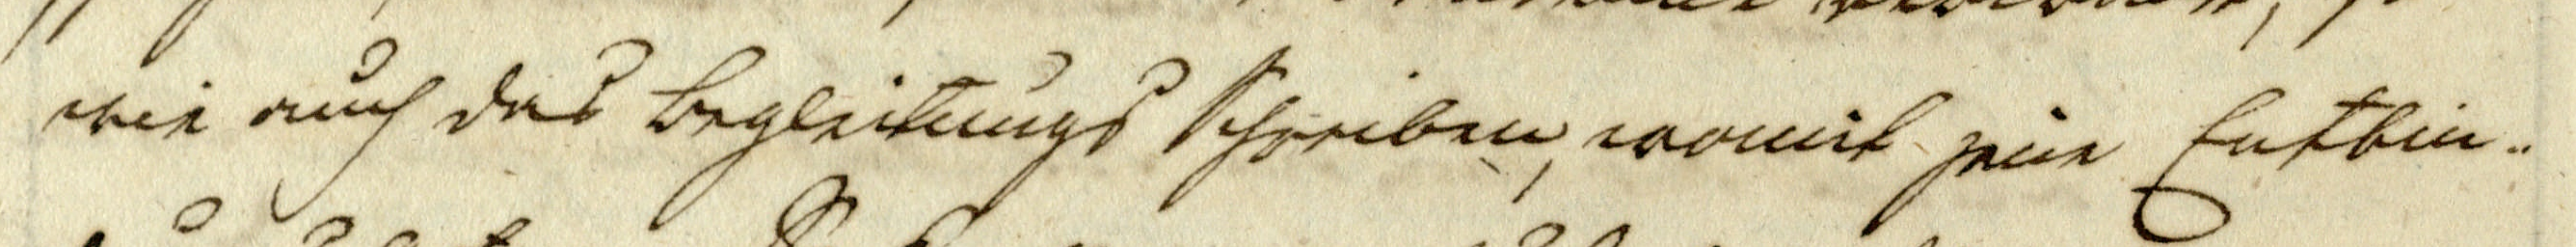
wie auch das Begleitungs Schreiben, womit jene Entbin¬
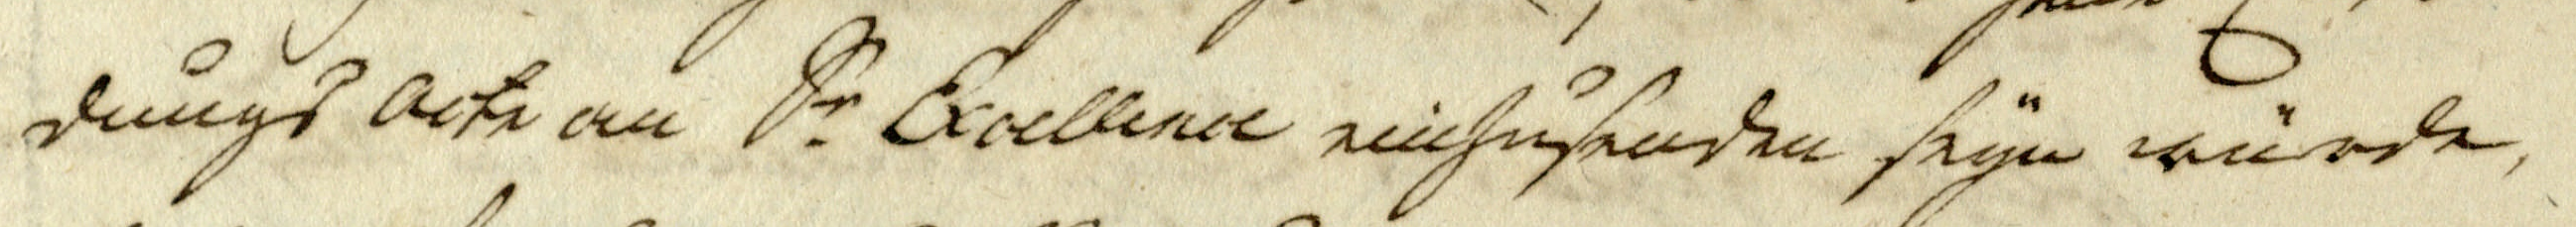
dungs Acte an Sr. Excellence einzusenden seÿn würde,
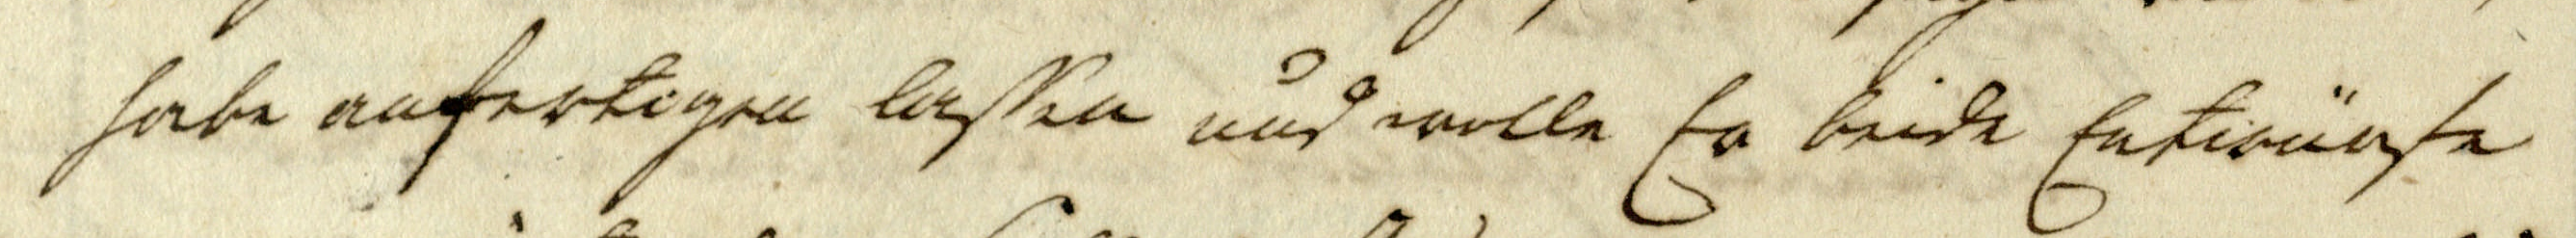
habe anfertigen lassen und wolle Er beide Entwürfe
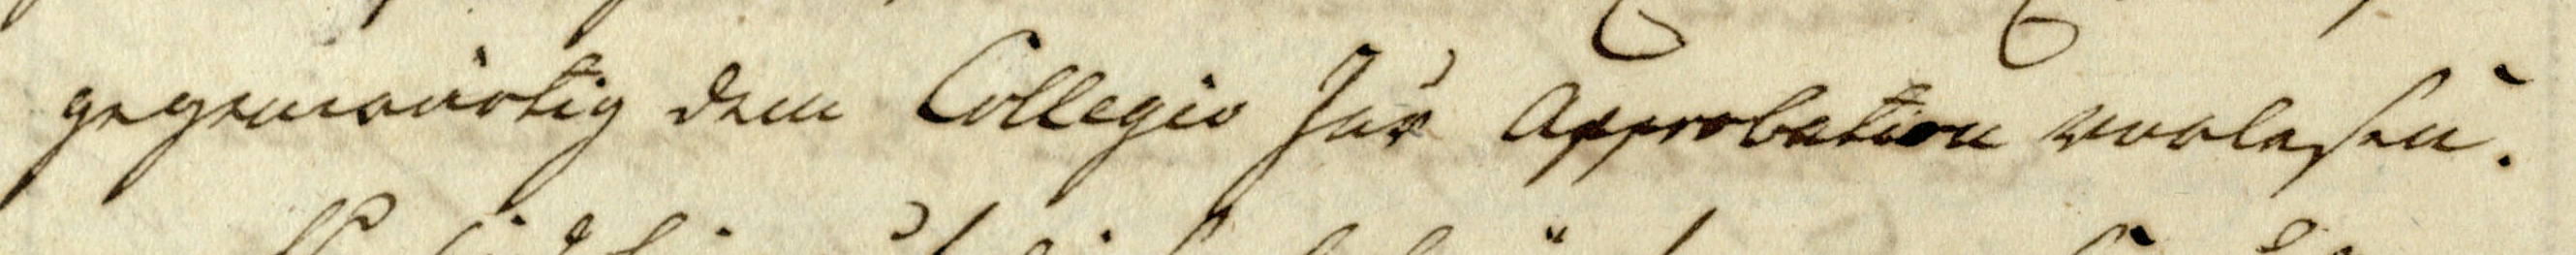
gegenwärtig dem Collegio zur Approbation vorlesen.
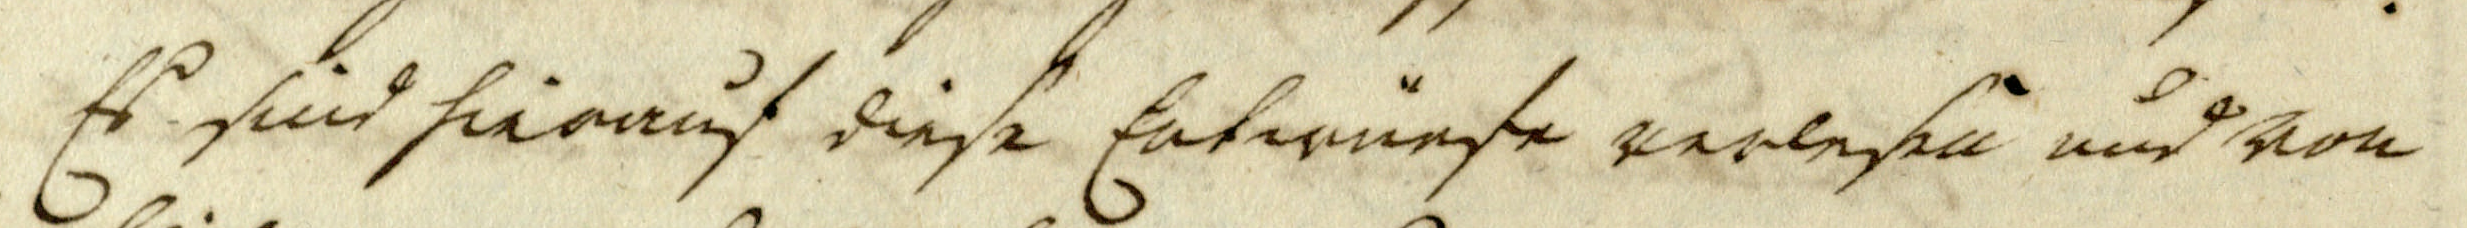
Es sind hierauf diese Entwürfe verlesen und von
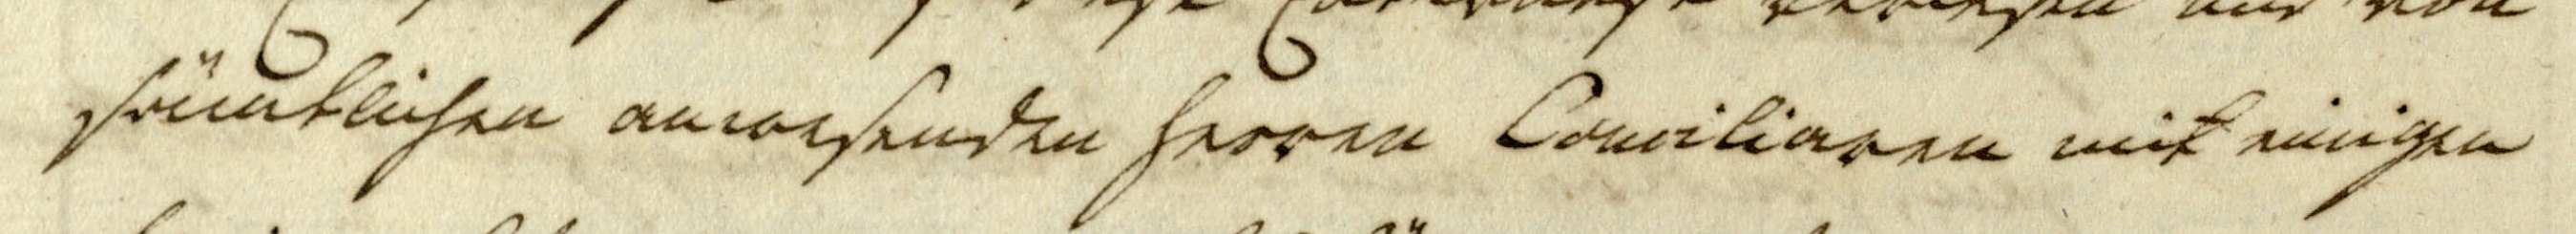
sämtlichen anwesenden herren Conciliaren mit einigen
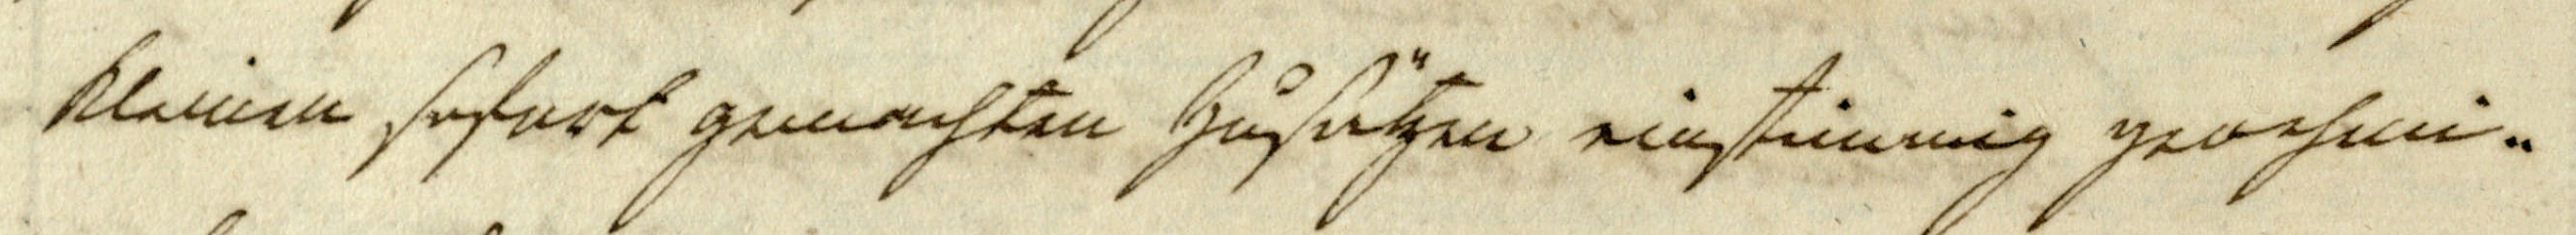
kleinen sofort gemachten Zusätzen einstimmig genehmi¬
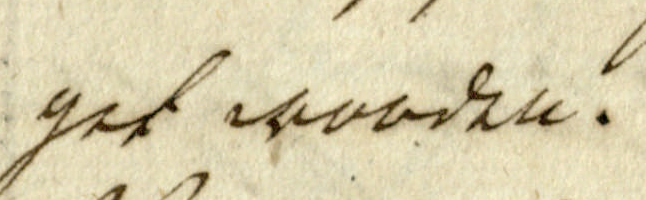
get worden.
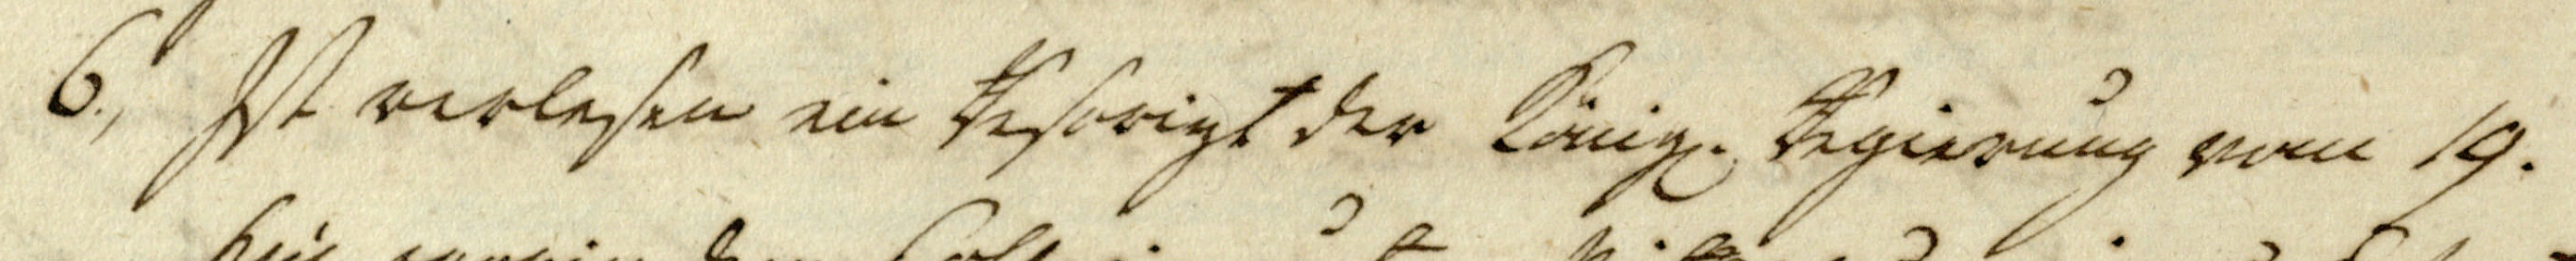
6., Ist verlesen ein Rescript der Königl. Regierung vom 19.
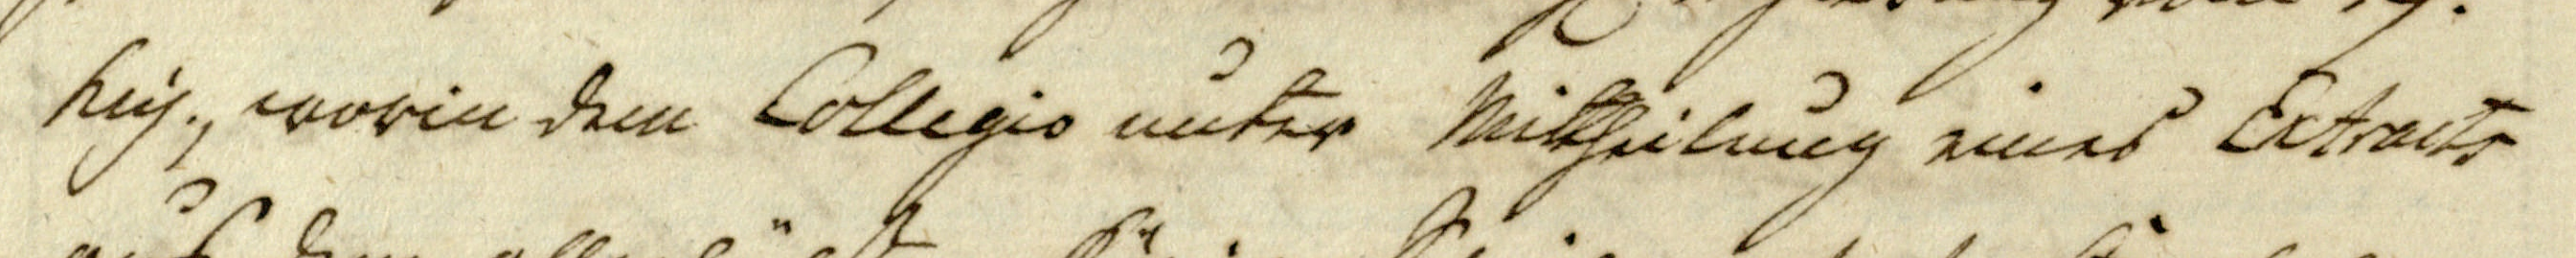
huj., worin dem Collegio unter Mittheilung eines Extracts
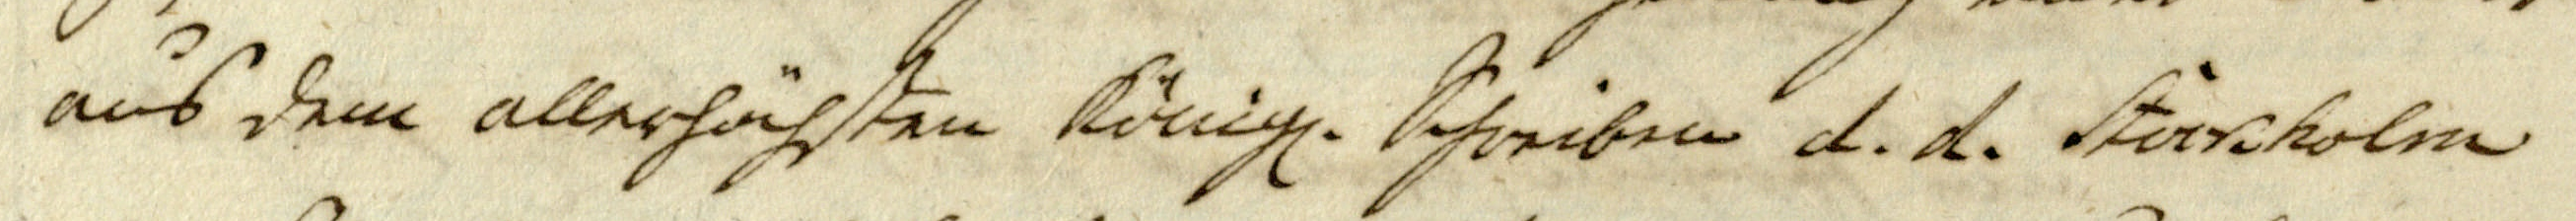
aus dem allerhöchsten Königl. Schreiben d. d. Stockholm
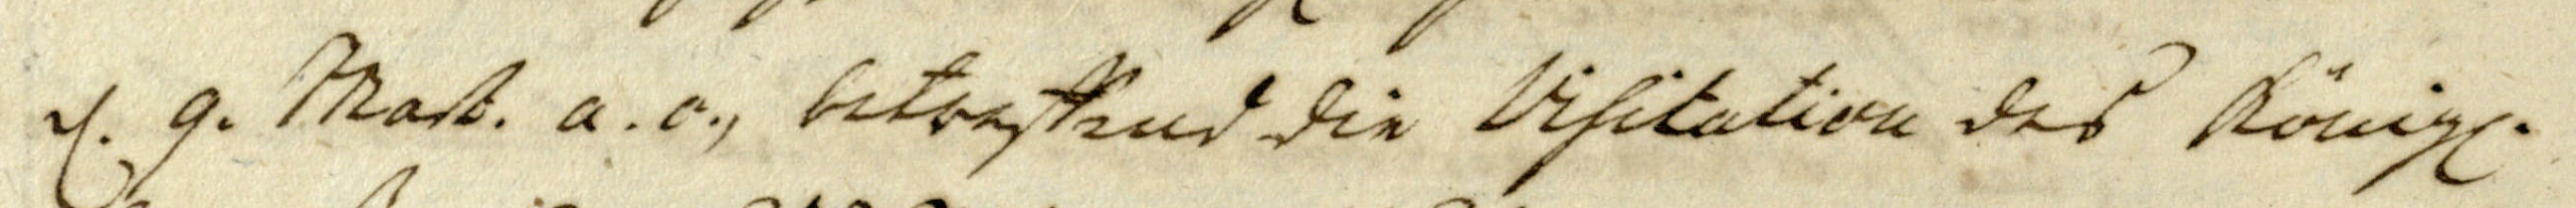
l. 9. Mart. a. c., betreffend die Visitation des Königl.
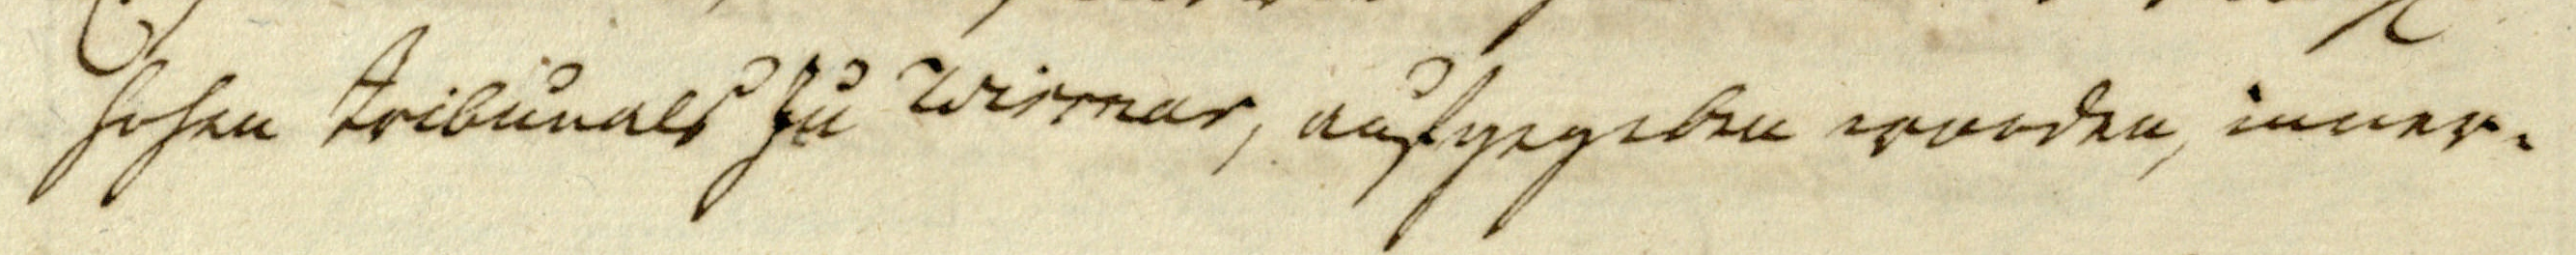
hohen Tribunals zu Wismar, aufgegeben worden, inner¬
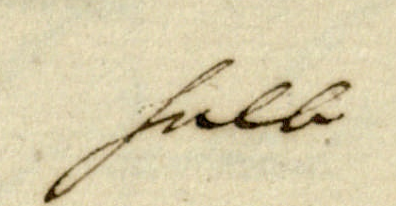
halb
